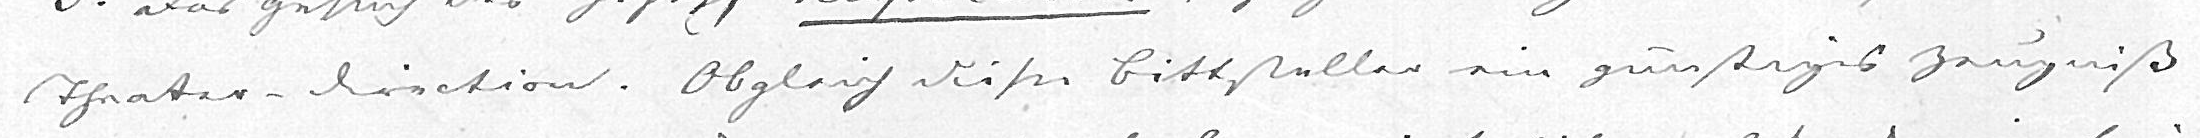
Theater-Direction. Obgleich dieser Bittsteller ein günstiges Zeugniß
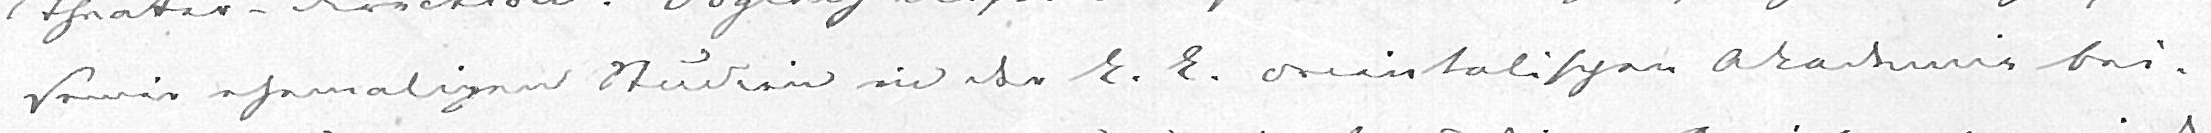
seiner ehemaligen Studien in der k.k. orientalisschen Akademie bei-
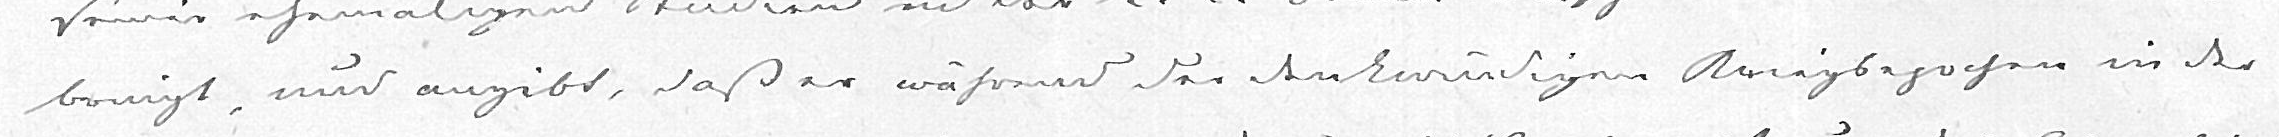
bringt, und angibt, daß er während der denkwürdigen Kriegsepochen in der
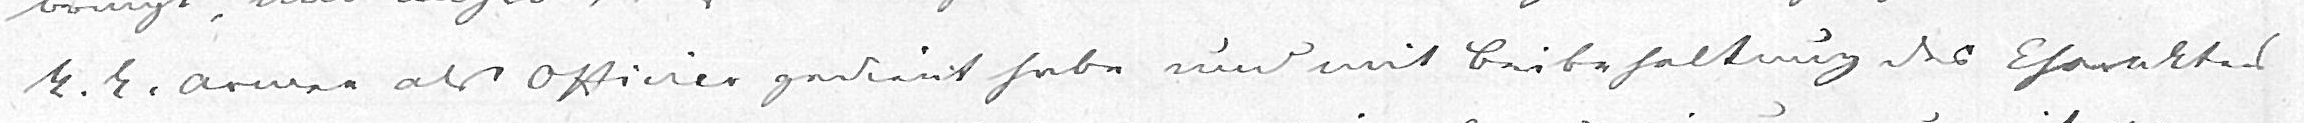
k.k. Armee als Officier gedient habe und mit Beibehaltng des Characters
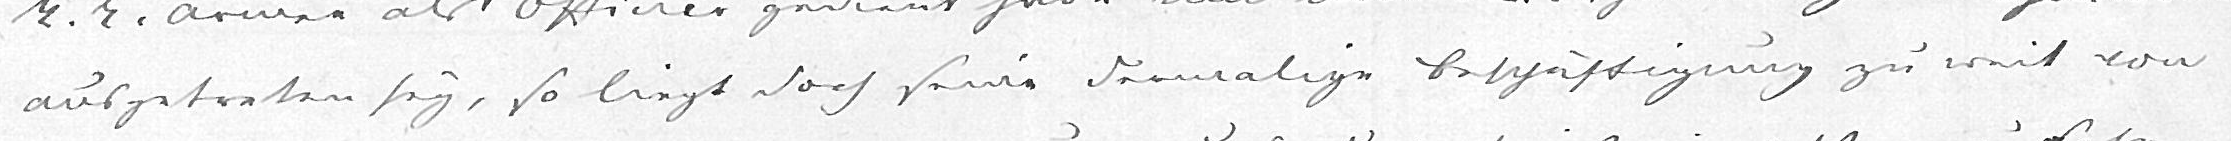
ausgetreten sey, so liegt doch seine dermalige Beschäftigung zu weit von
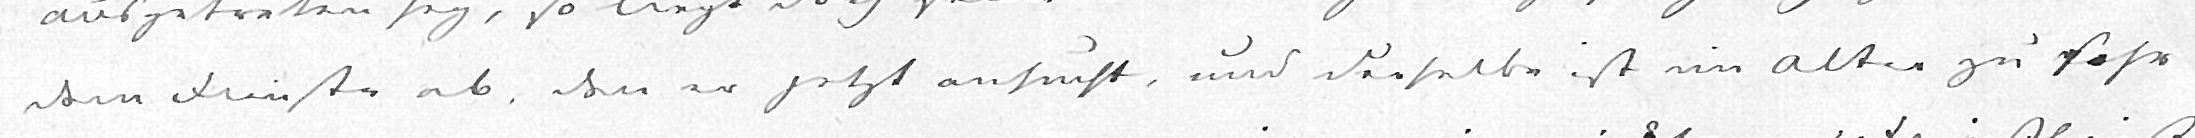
dem Dienst ab, den er jetzt ansucht, und derselbe ist im Alter zu sehr
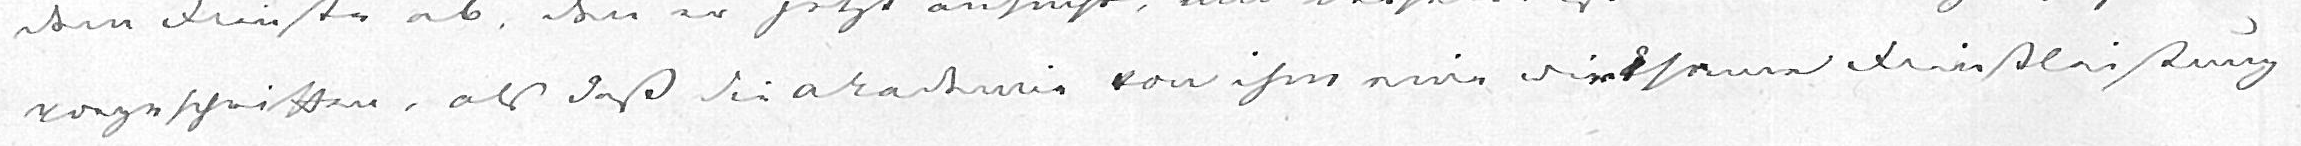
vorgeschitten, als daß die Akademie von ihm eine wirksame Dienstleistung
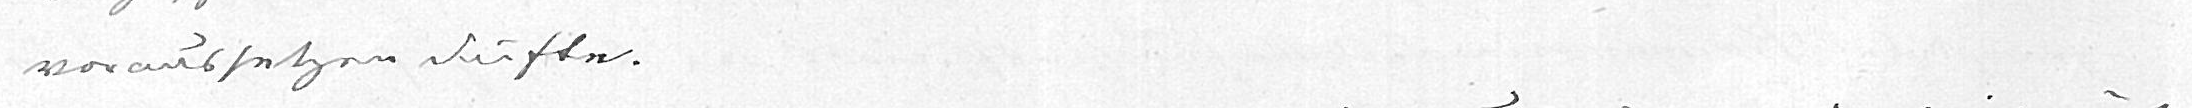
voraussetzen dürfte.
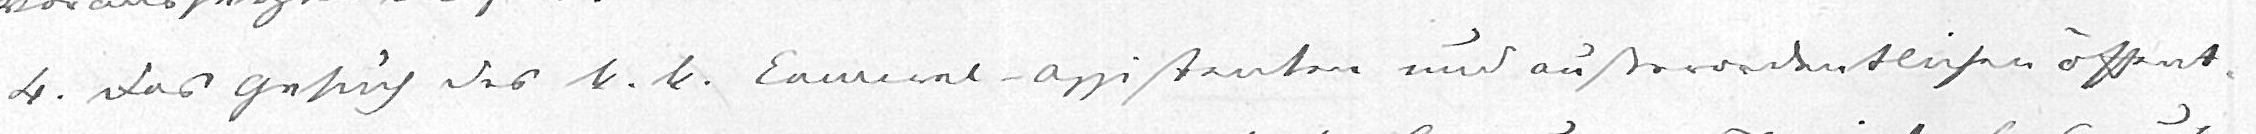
4. Das Gesuch des k.k. Cameral-Assistenten und außerodentlichen öffent-
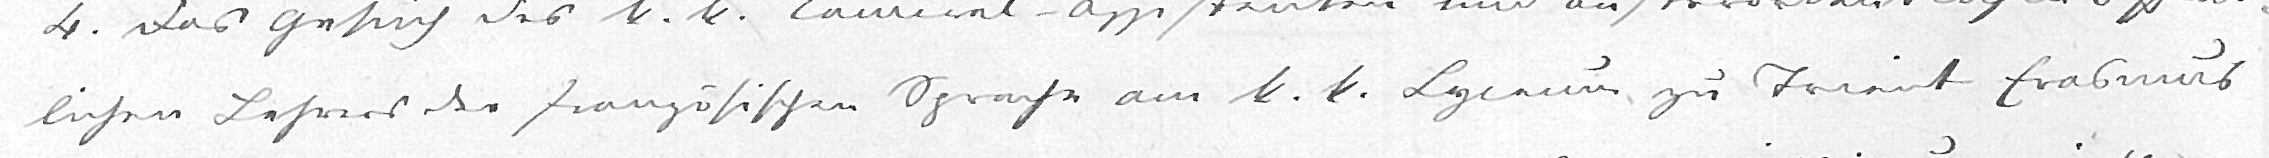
lichen Lehrers der französischen Sprache am k.k. Lyceum zu Trient Erasmus
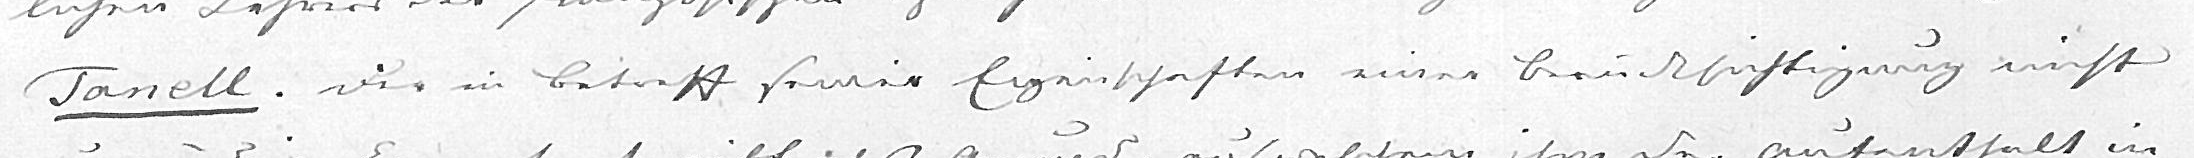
Tanell, der in betreff seiner Eigenschaften einer Berücksichtigung nicht
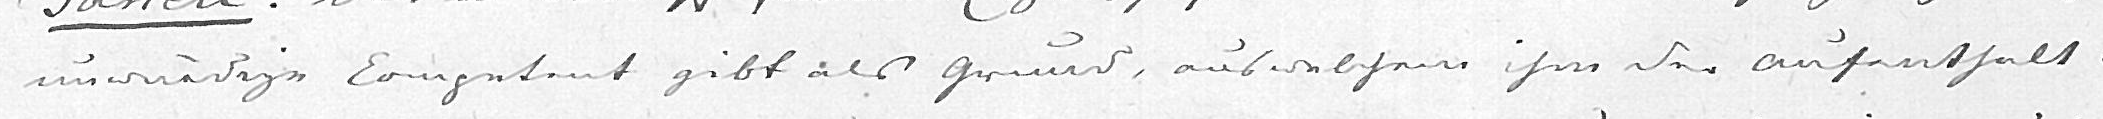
unwürdige Competent gibt als Grund, aus welchem ihm der Aufenthalt in
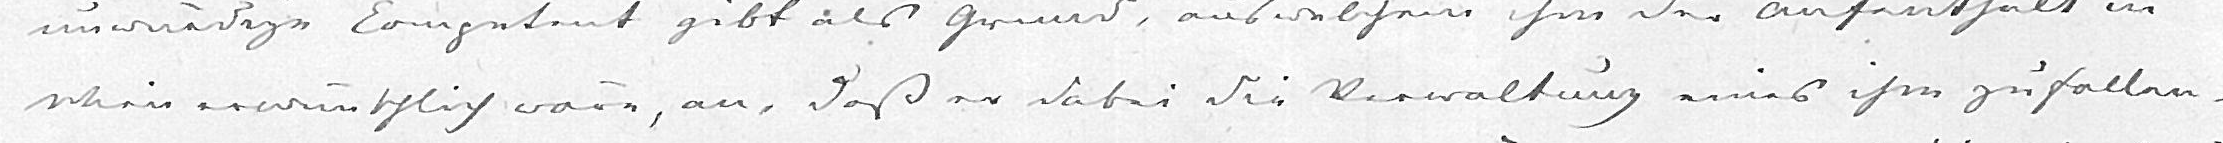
Wien erwünschlich wäre, an, daß er dabei die Verwaltung eines ihm zugefallen-
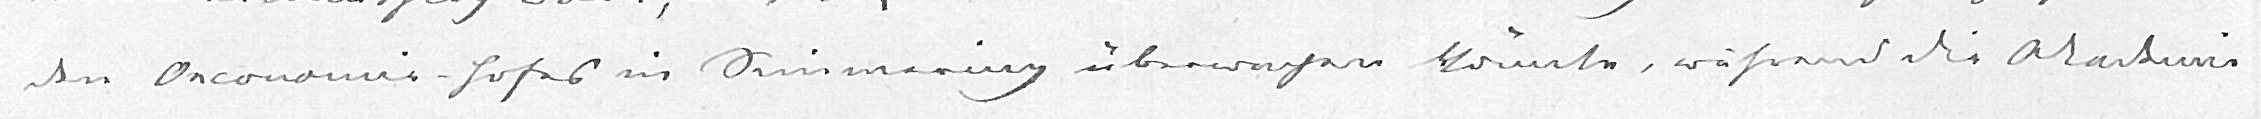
en Oeconomie-Hofes in Simmering überwachen könnte, während die Akademie
